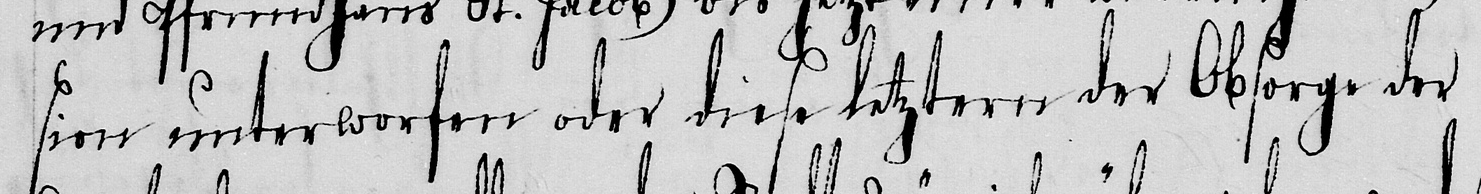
sion unterworfen oder diese letztern der Absorge der
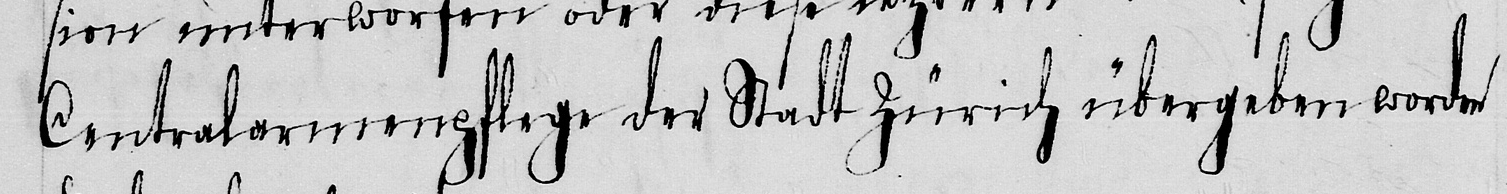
Centralarmenpflege der Stadt Zürich übergeben worden
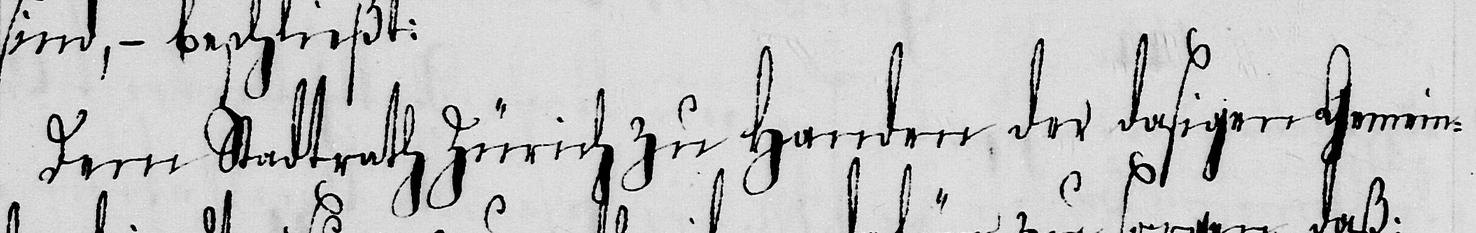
Dem Stadtrath Zürich zu Handen der dasigen Gemein¬
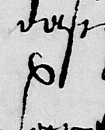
sol¬
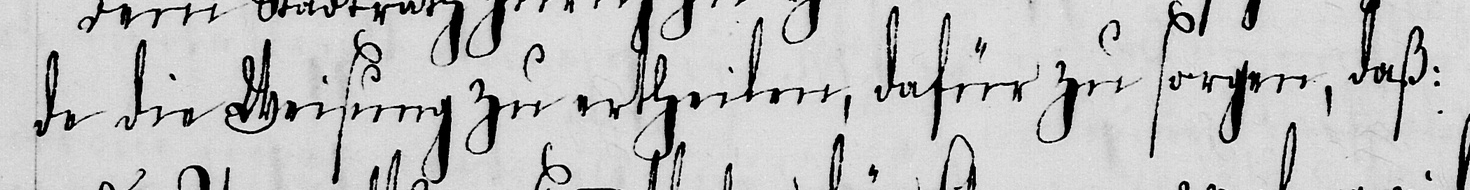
de die Weisung zu ertheilen, dafür zu sorgen, daß:
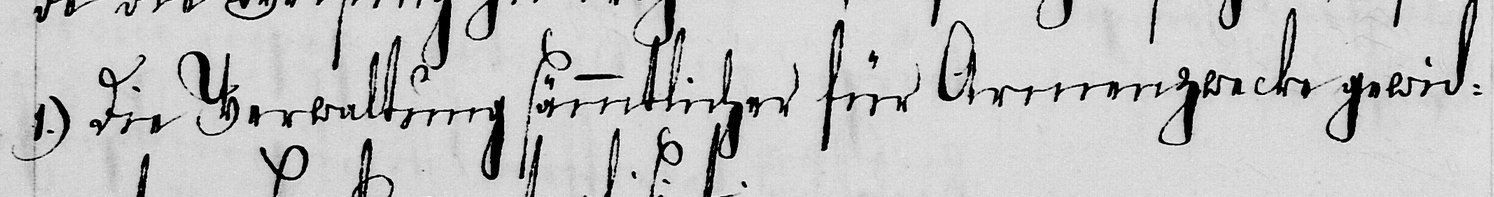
1.) Die Verwaltung sämmtlicher für Armenzwecke gewid¬
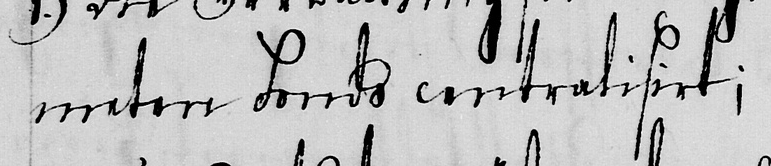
meten Fonds centralisirt;
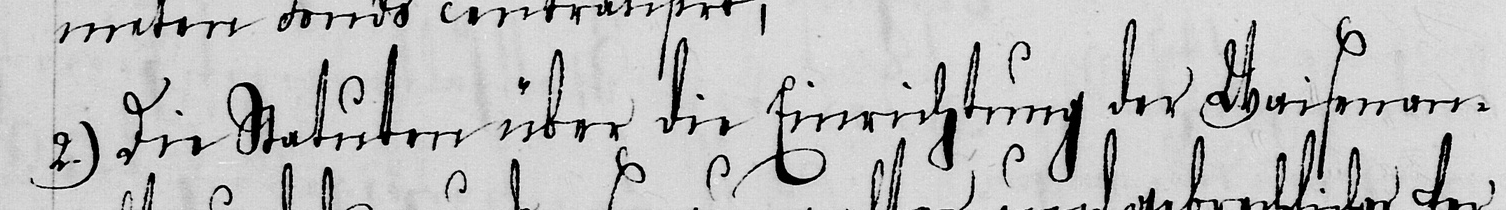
2.) Die Statuten über die Einrichtung der Waisenan¬
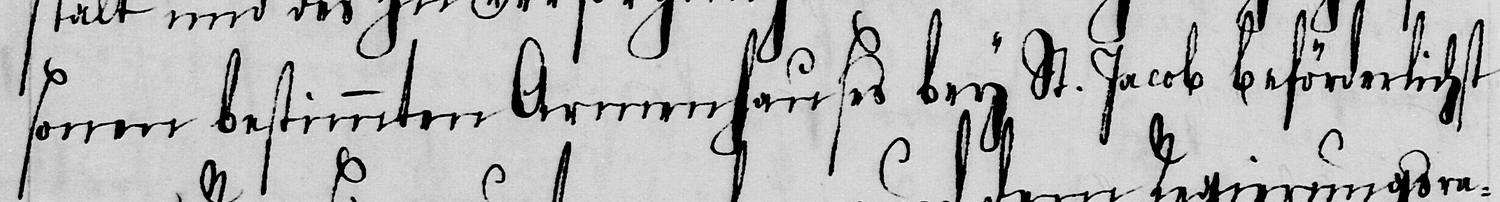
sonen bestimmten Armenhauses bey St. Jacob beförderlichst
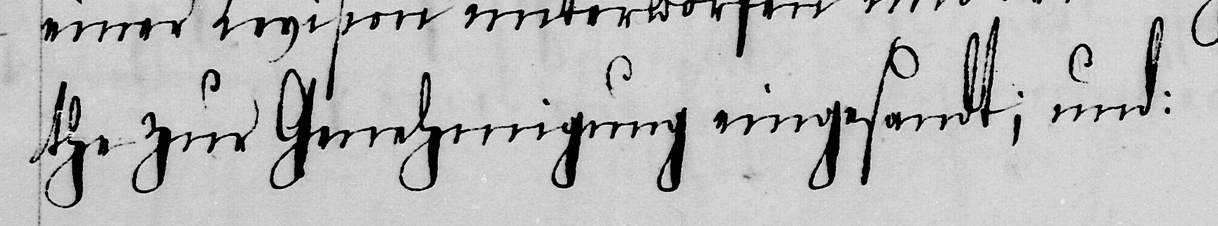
the zur Genehmigung eingesandt; und:
